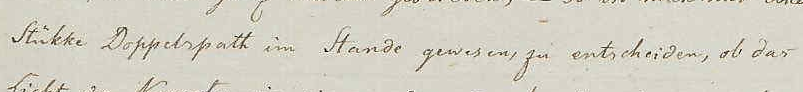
Stükke Doppelspath im Stande gewesen, zu entscheiden, ob das
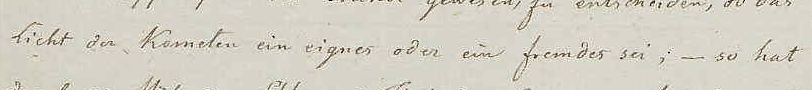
Licht der Kometen ein eignes oder ein fremdes sei; – so hat
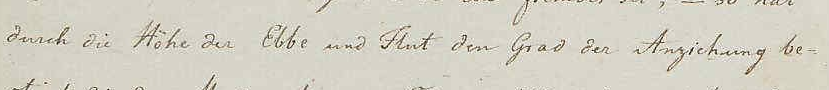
durch die Höhe der Ebbe und Flut den Grad der Anziehung be-
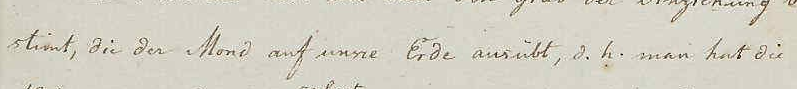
stimt, die der Mond auf unsre Erde ausübt, d. h. man hat die
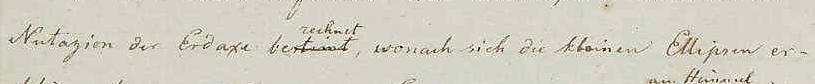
Nutazion der Erdaxe bestimtrechnet, wonach sich die kleinen Ellipsen er-
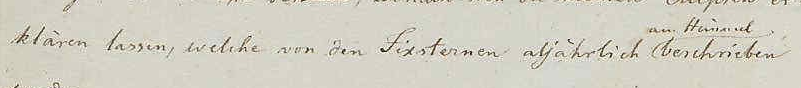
klären lassen, welche von den Fixsternen aljährlich am Himmel beschrieben
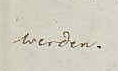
werden.
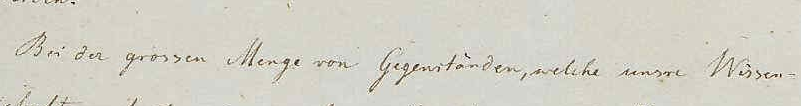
Bei der grossen Menge von Gegenständen, welche unsre Wissen-
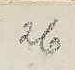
geben.
